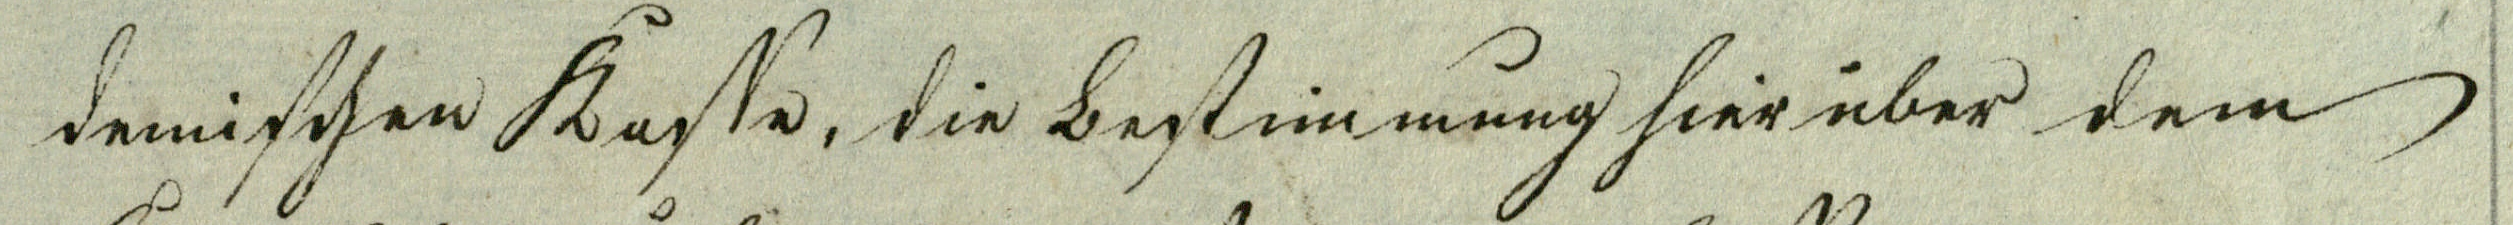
demischen Kasse, die Bestimmungen hierüber dem
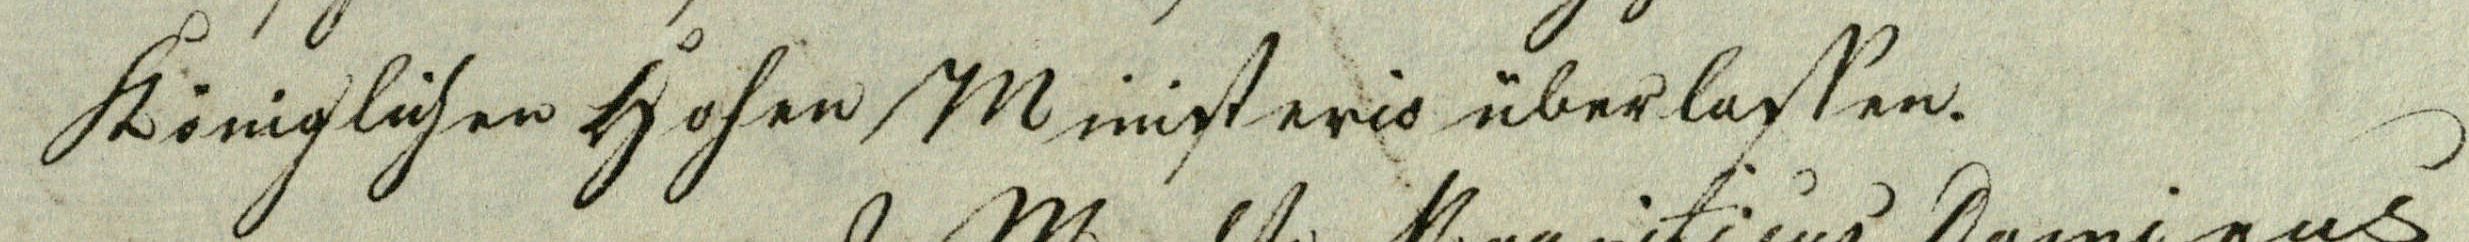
Königlichen Hohen Ministerio überlassen.
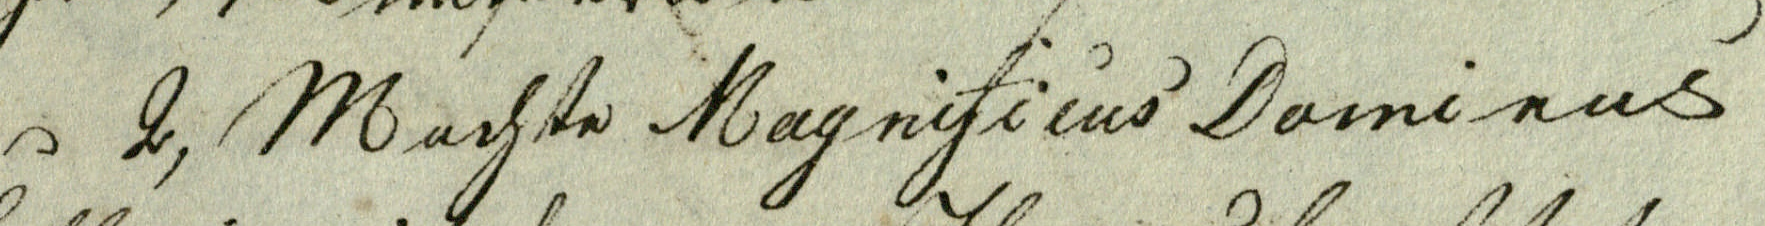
2. Machte Magnificus Dominus
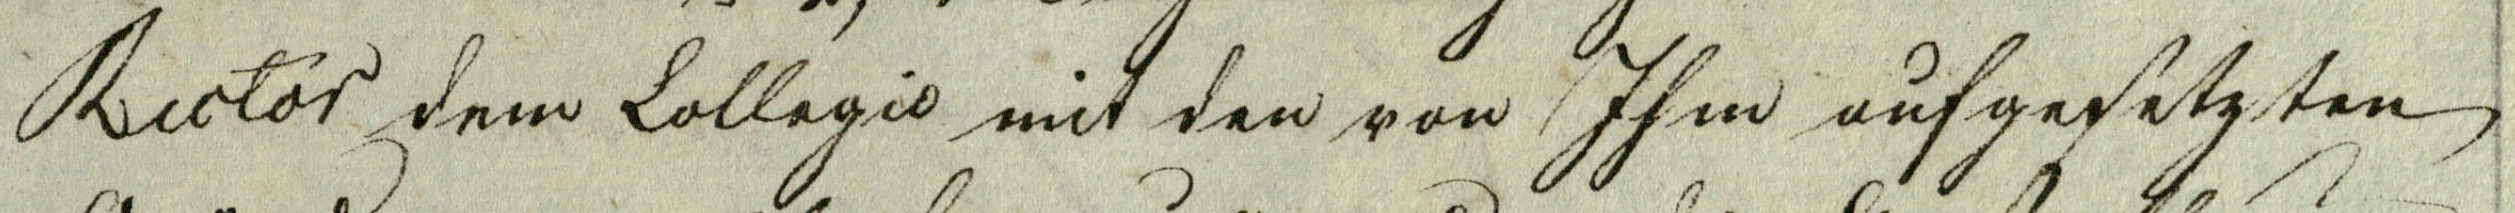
Rector dem Collegio mit den von Ihm aufgesetzten
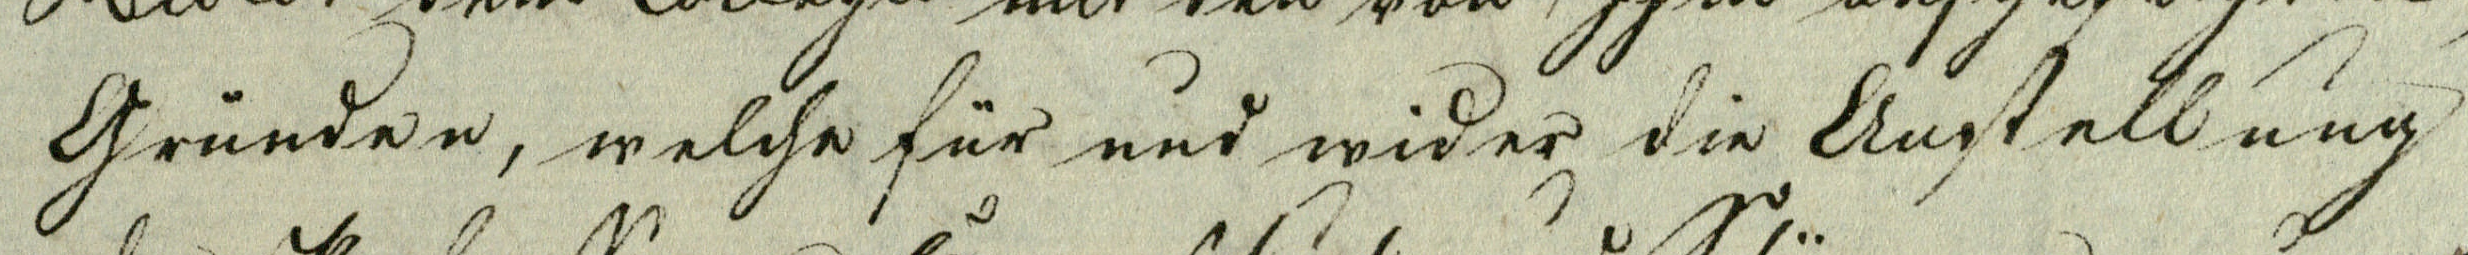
Gründen, welche für und wider die Anstellung
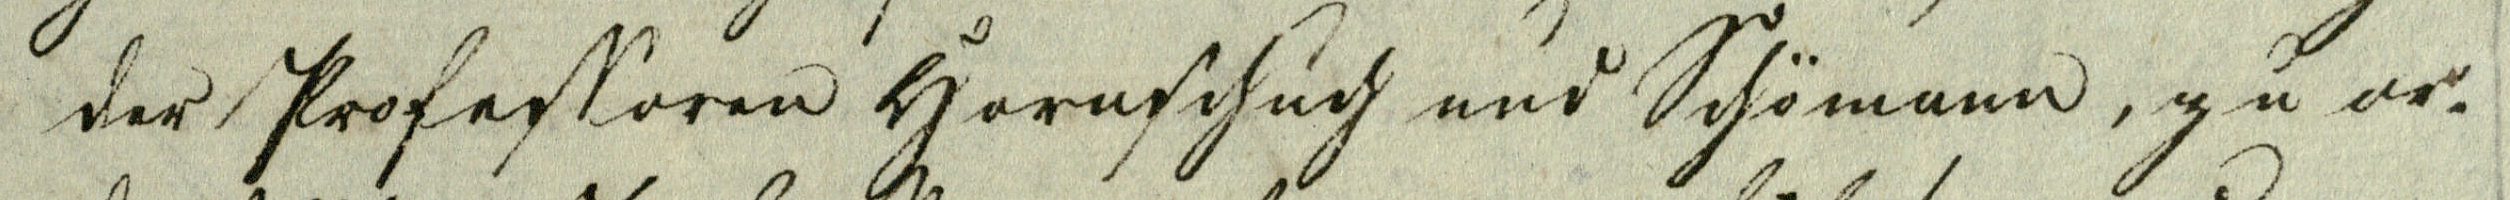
der Professoren Hornschuch und Schömann, zu or¬
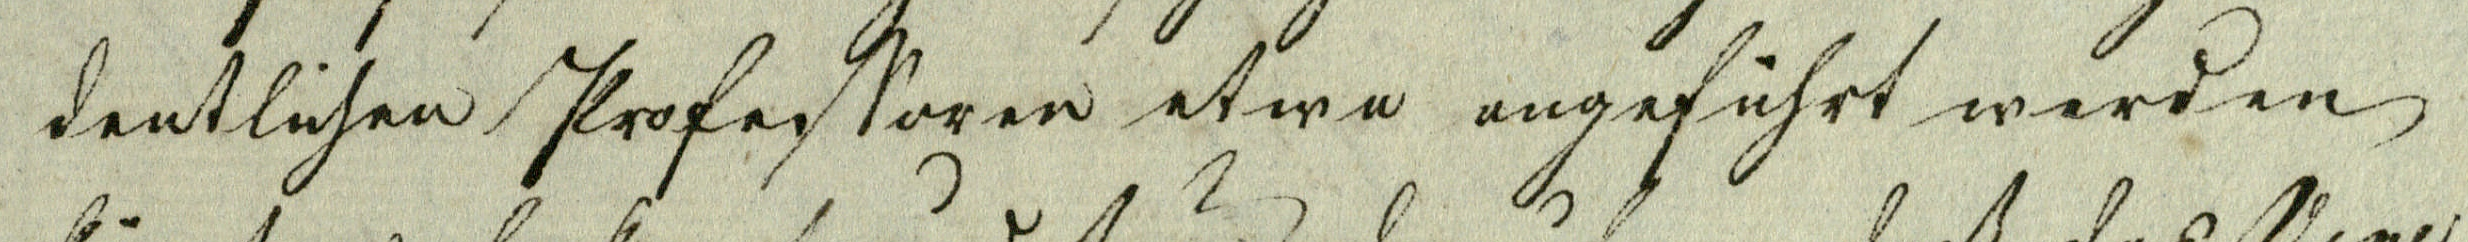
dentlichen Professoren etwa angeführt werden
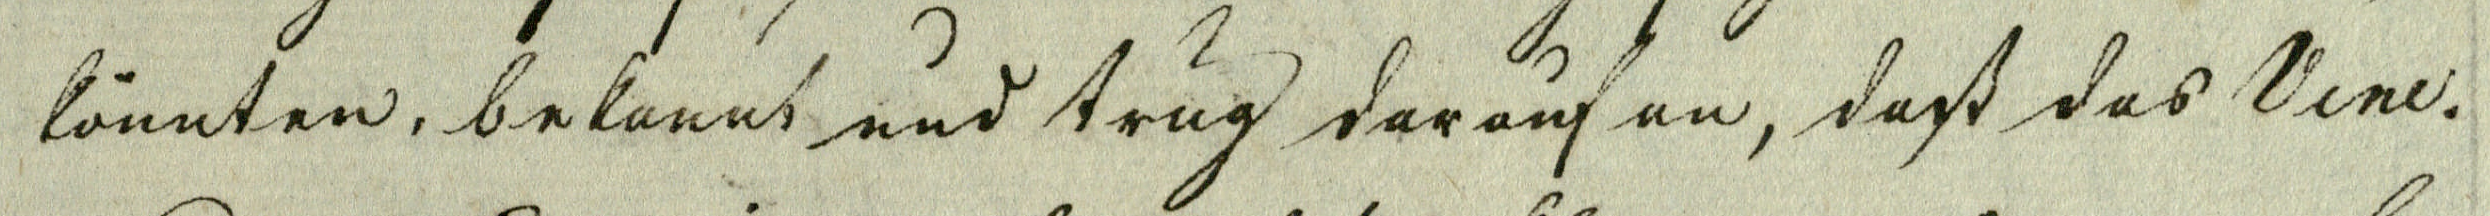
könnten, bekannt und trug darauf an, daß das Vene¬
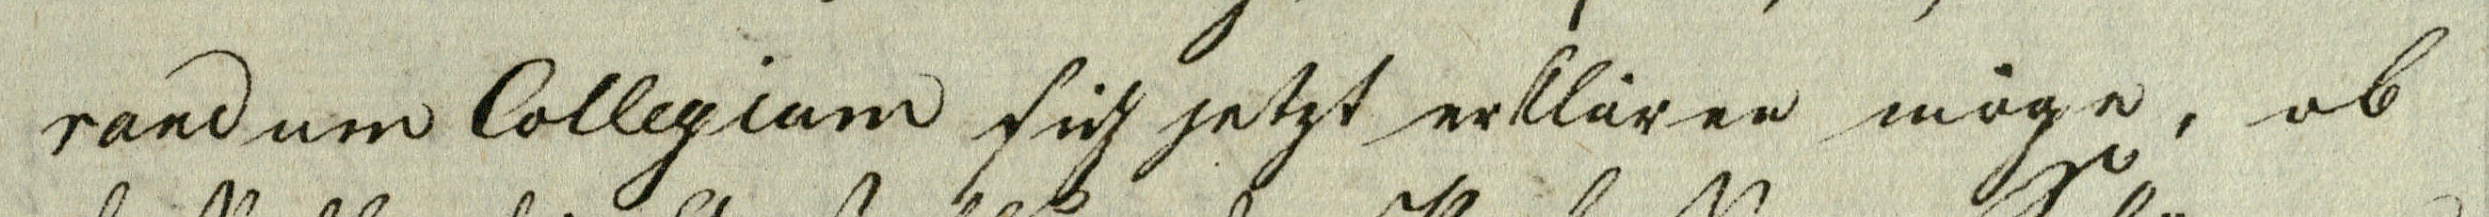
randum Collegium sich jetzt erklären möge, ob
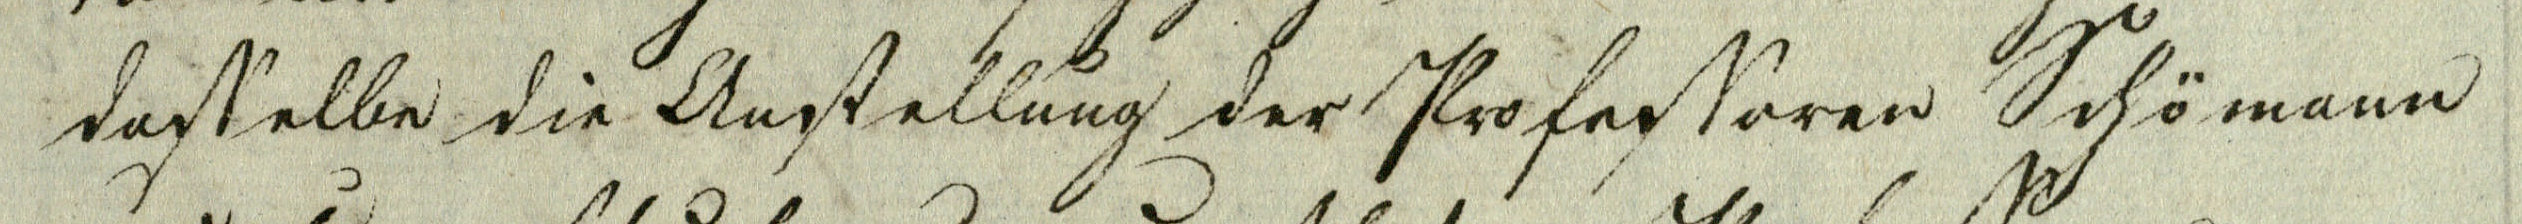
dasselbe die Anstellung der Professoren Schömann
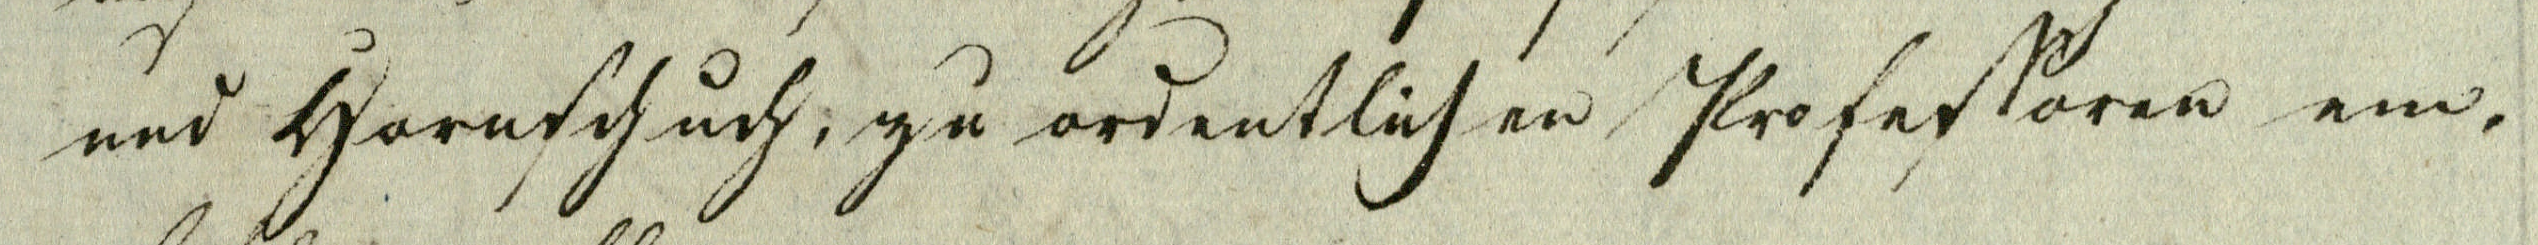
und Hornschuch; zu ordentlichen Professoren em¬
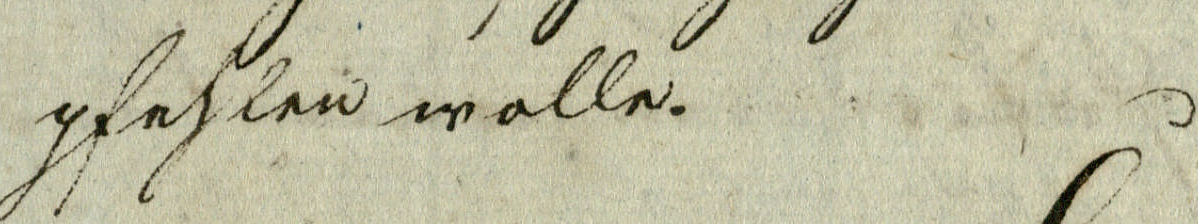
pfehlen wolle.
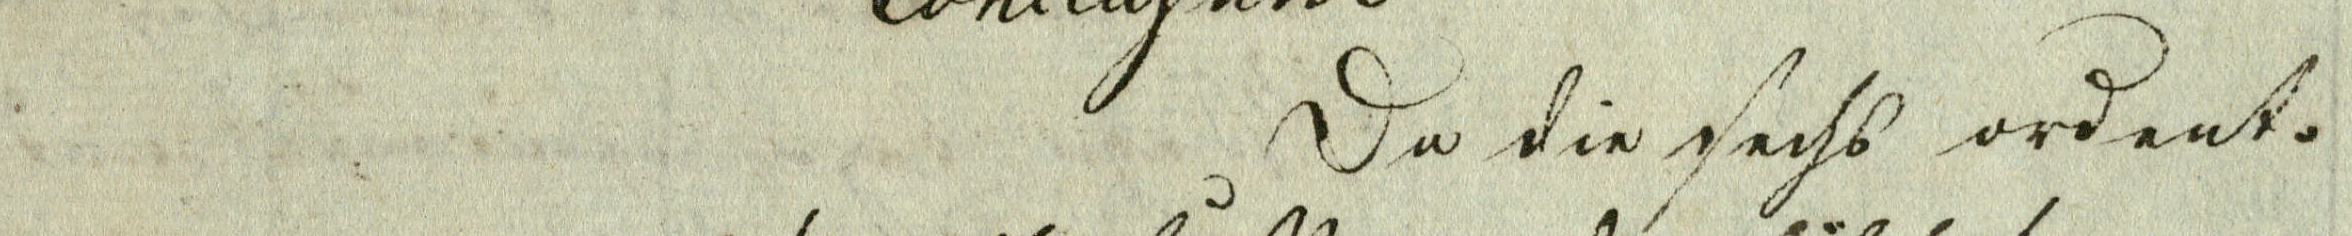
Da die sechs ordent¬
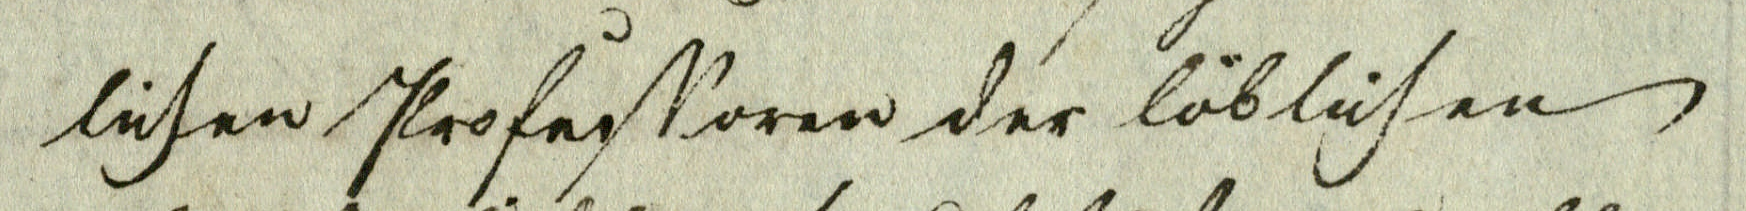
lichen Professoren der löblichen
